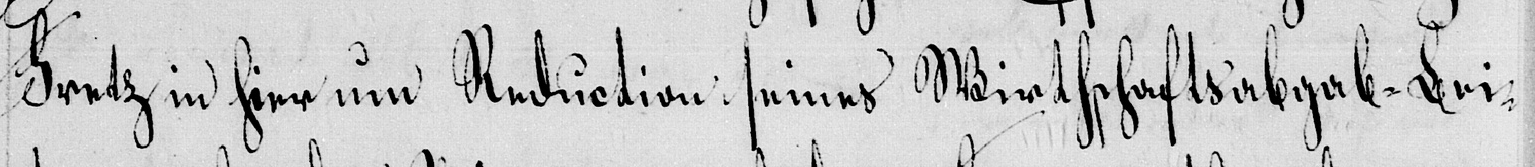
Fretz in hier um Reduction seines Wirthschaftsabgab-Bei¬
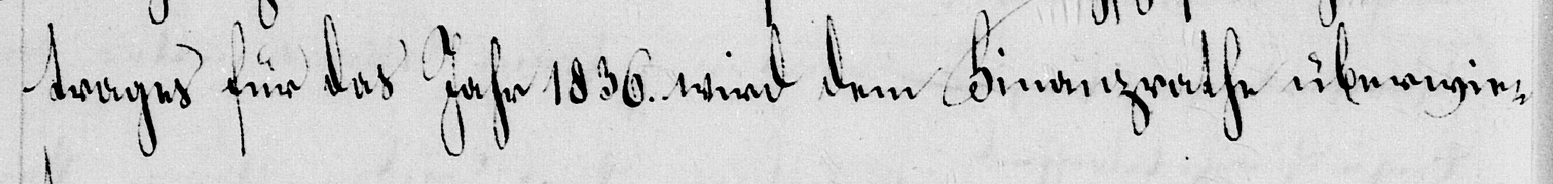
trages für das Jahr 1830. wird dem Finanzrath überwie¬
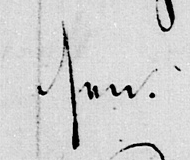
sen.
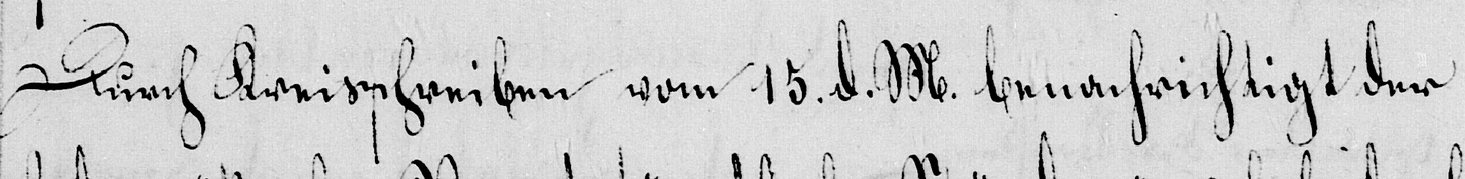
Durch Kreisschreiben vom 15. d. M. beauftragt der
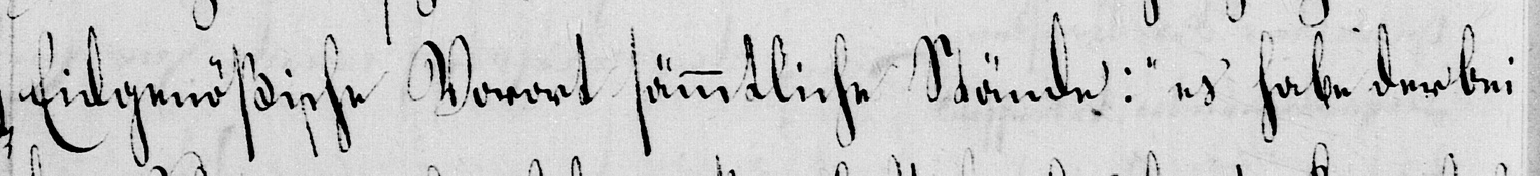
Eidgenößische Vorort sämmtliche Stände: „es habe der bei
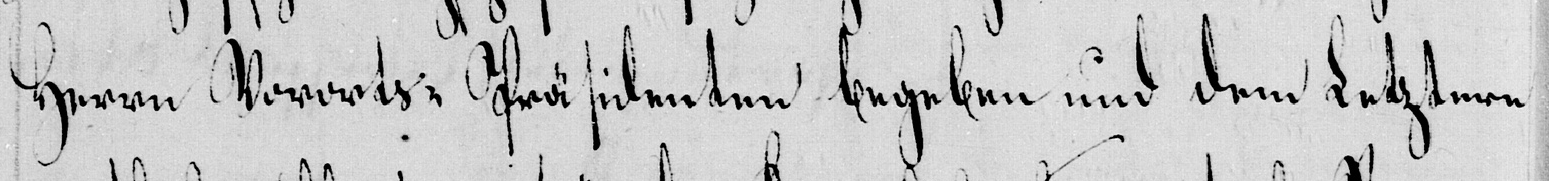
Herrn Vororts-Präsidenten begeben und dem Letztern
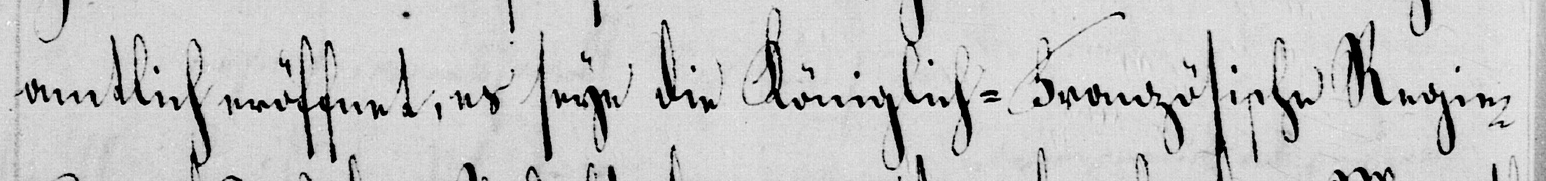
amtlich eröffnet, es seye die Königlich-Französische Regie¬
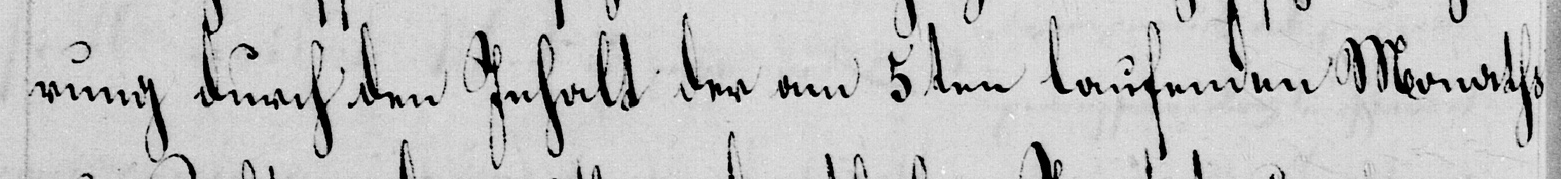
rung durch den Inhalt der am 5ten laufenden Monaths
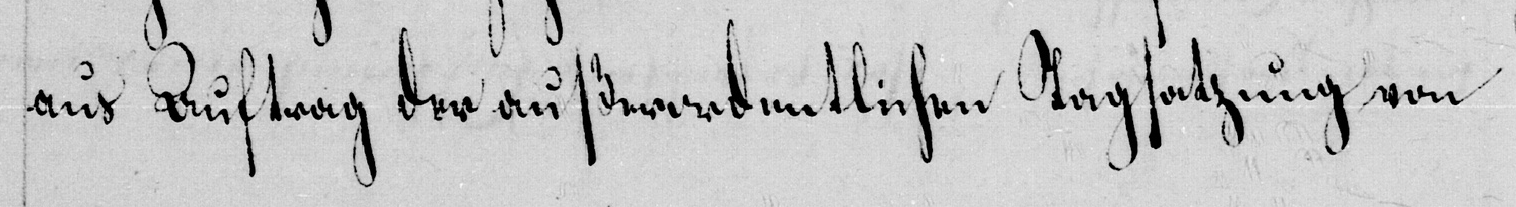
aus Auftrag der außerordentlichen Tagsatzung von
